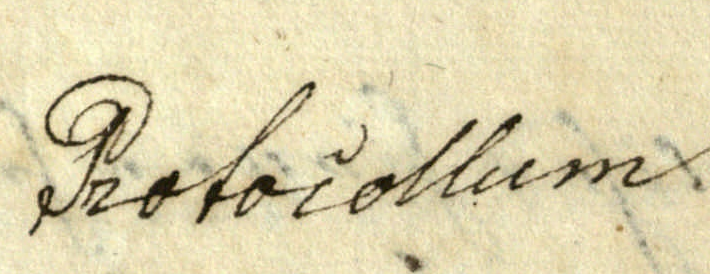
Protocollum
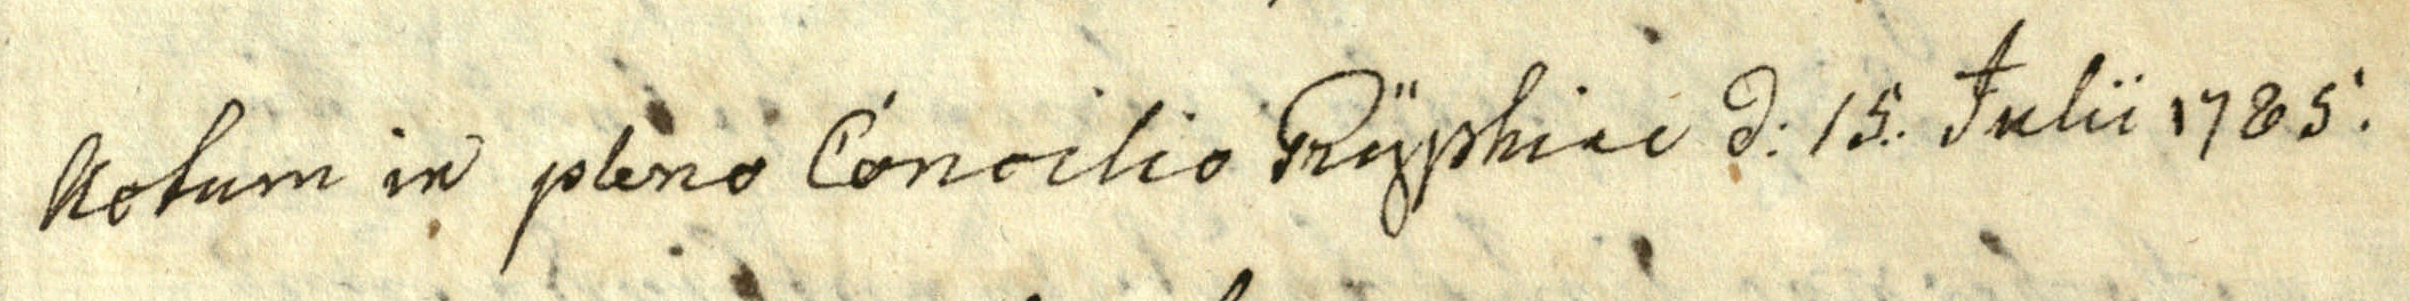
Actum in pleno Concilio Grÿphiae d. 15. Julii 1785.
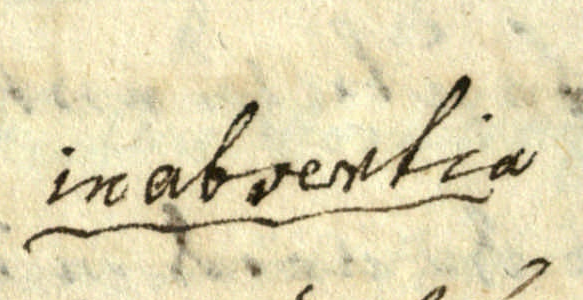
in absentia
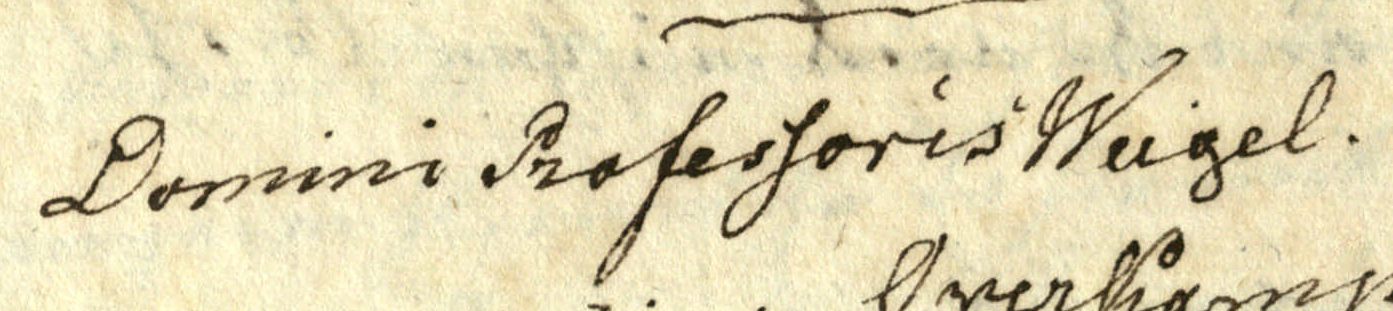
Domini Professoris Weigel.
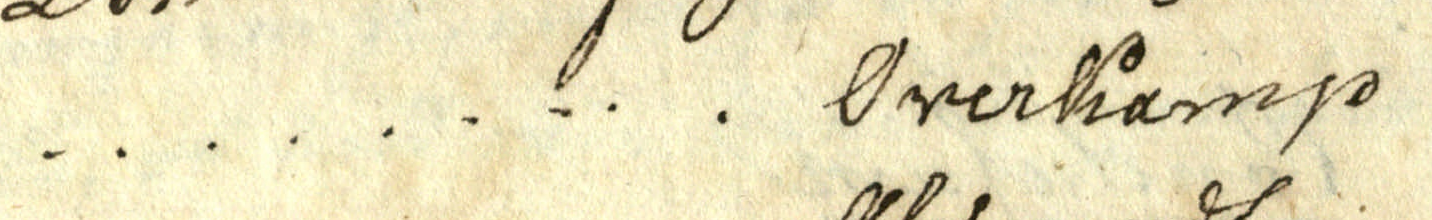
Overkamp
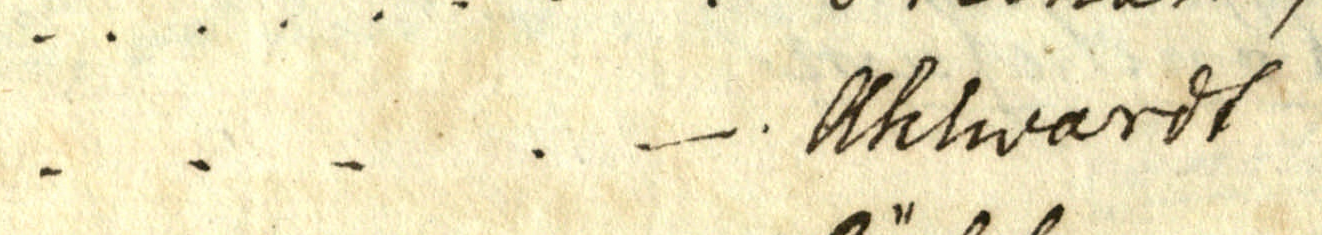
Ahlwardt.
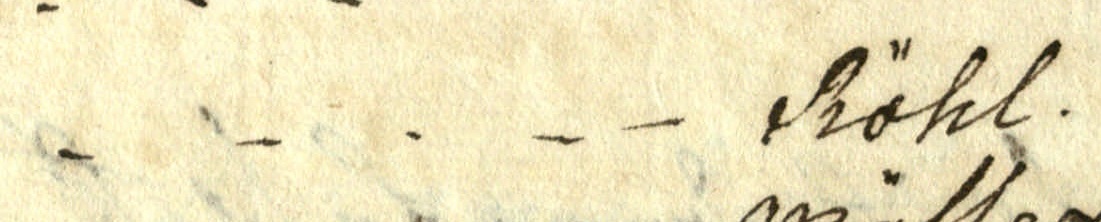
Röhl.
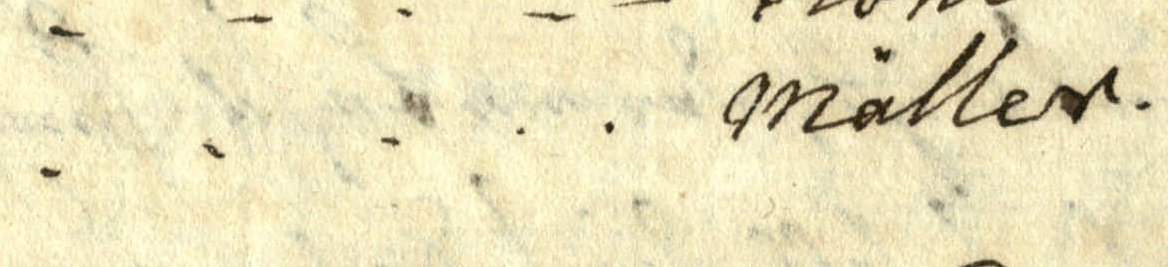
Möller.
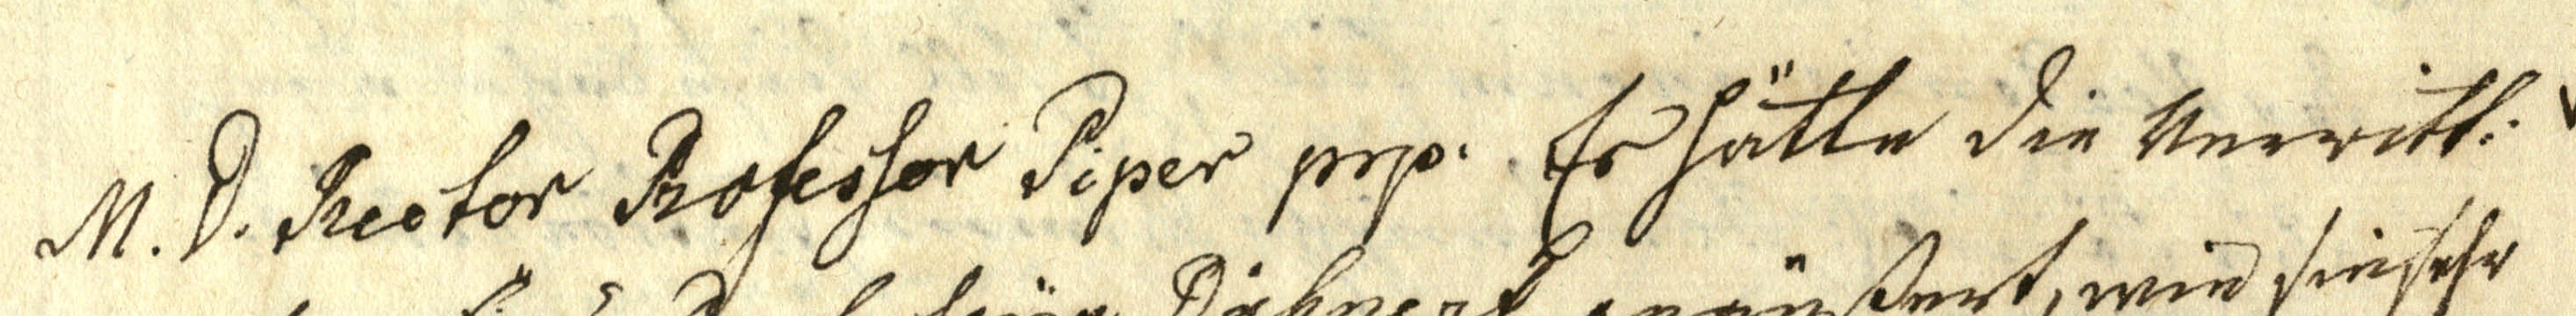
M. D. Rector Professor Piper prp. Es hätte die verwitt¬
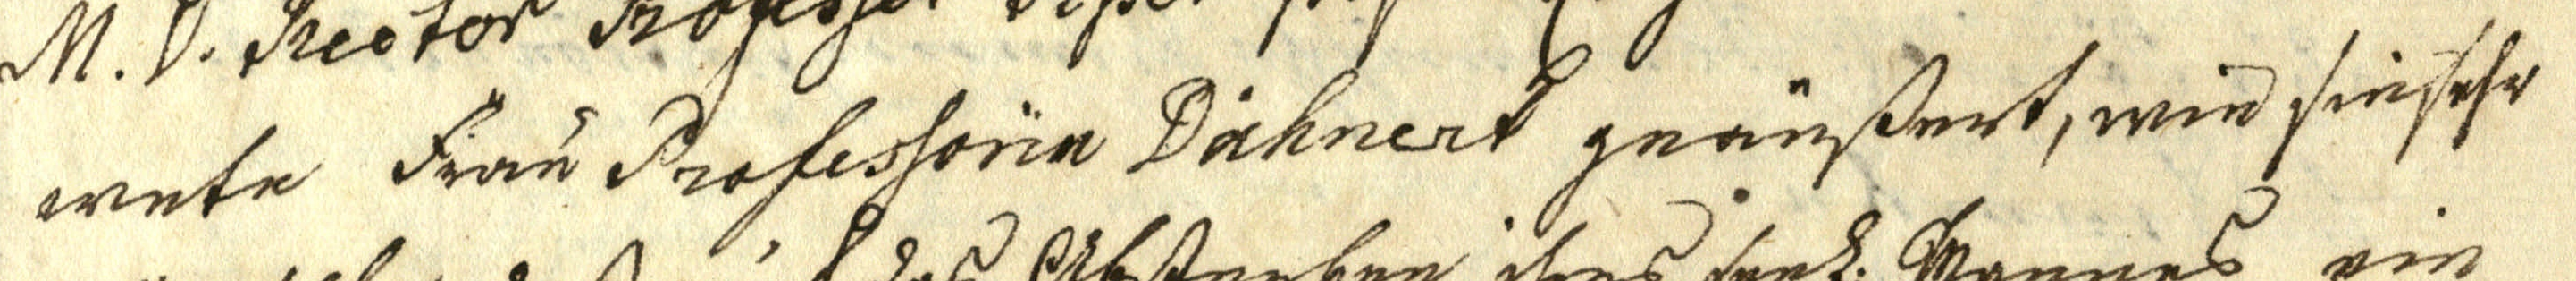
wete Frau Professorin Dähnert geäußert, wie siesehr
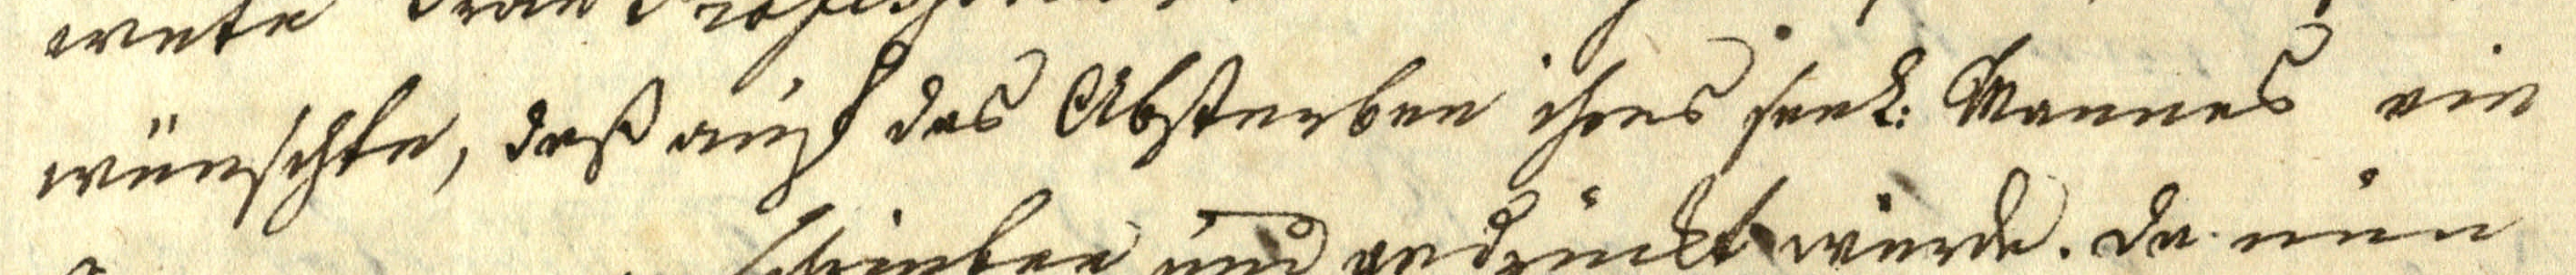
wünschte, daß auf das Absterben ihres seel. Mannes ein
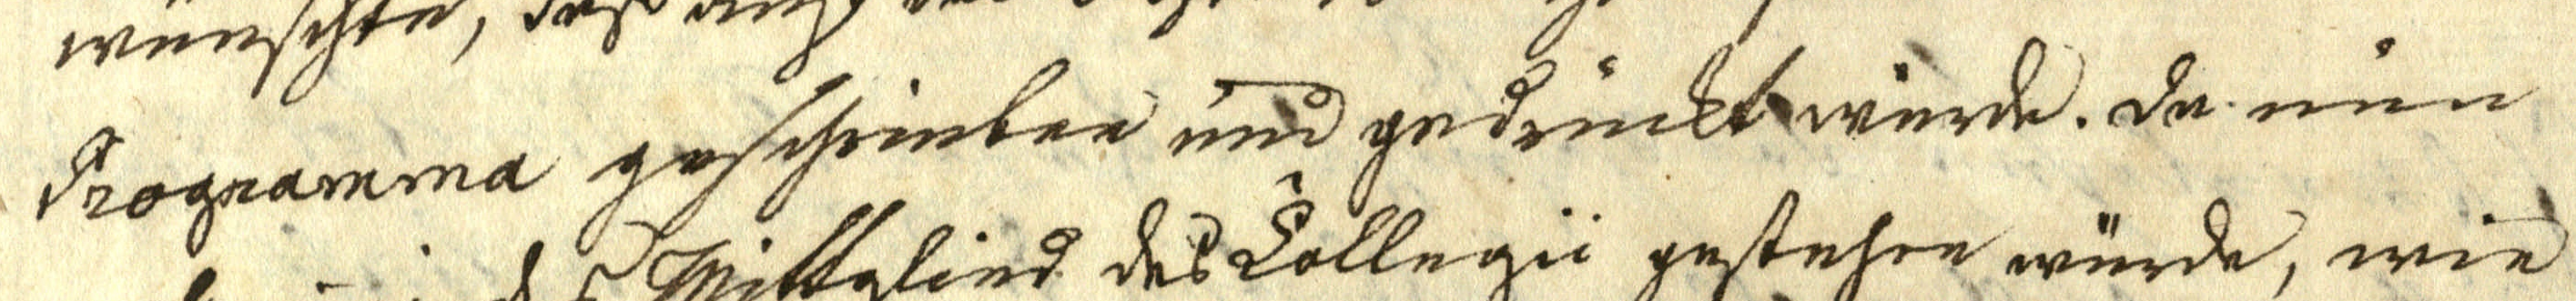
Programma geschrieben und gedruckt würde. Da nun
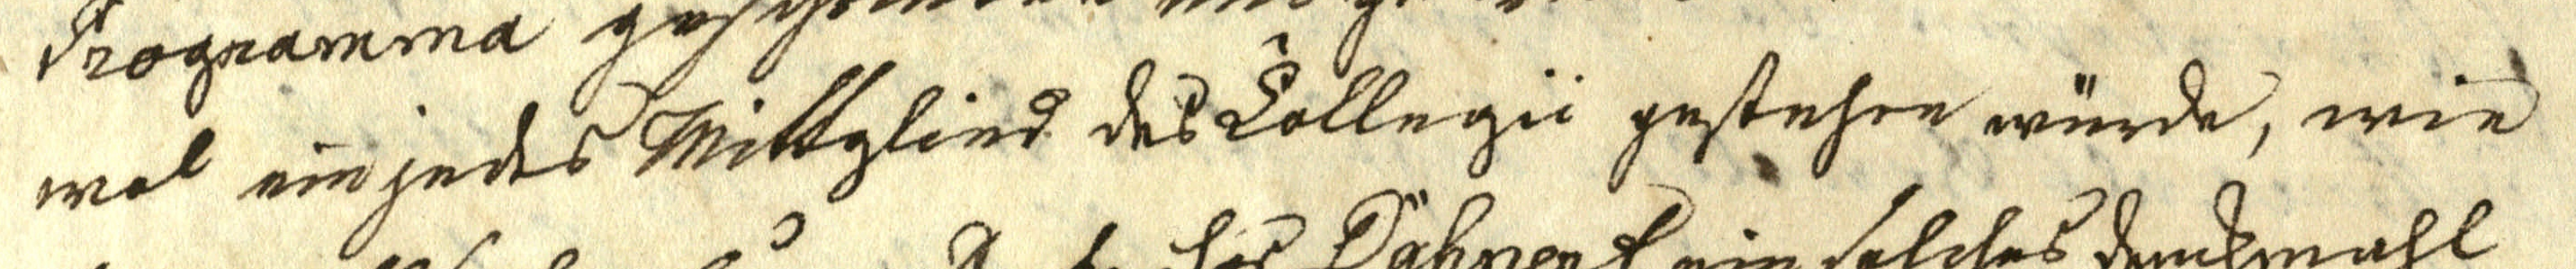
wol ein jedes Mittglied des Collegii gestehen würde, wie
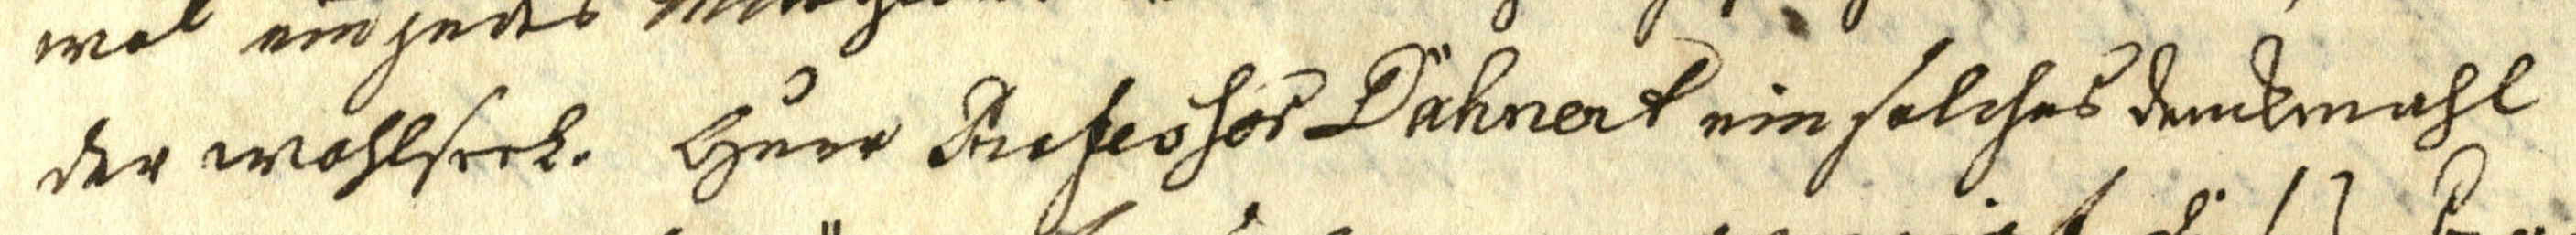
der wohlseel. Herr Professor Dähnert ein solches Denkmahl
